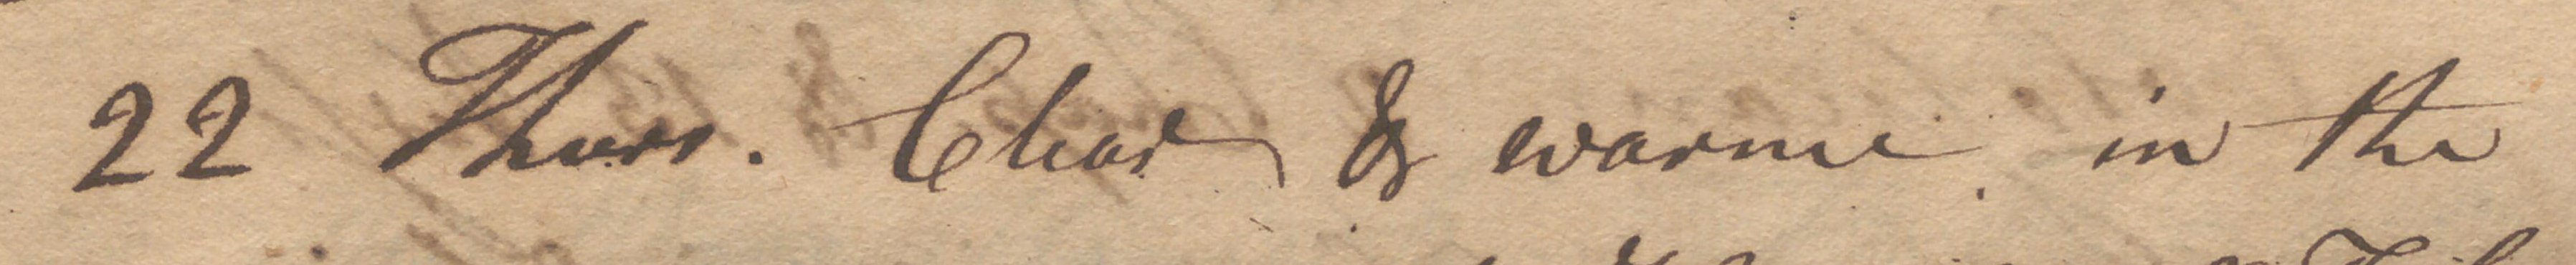22 Thurs. Clear & warme in the
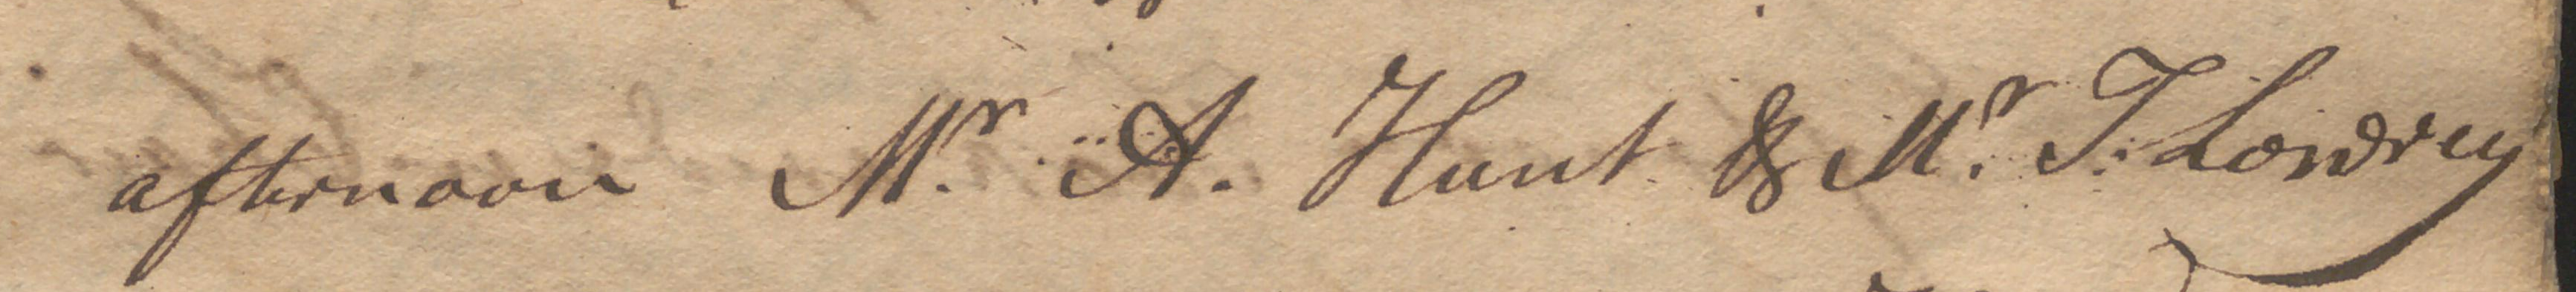afternoon M^r. A. Hunt & M^r. T. Lowrey
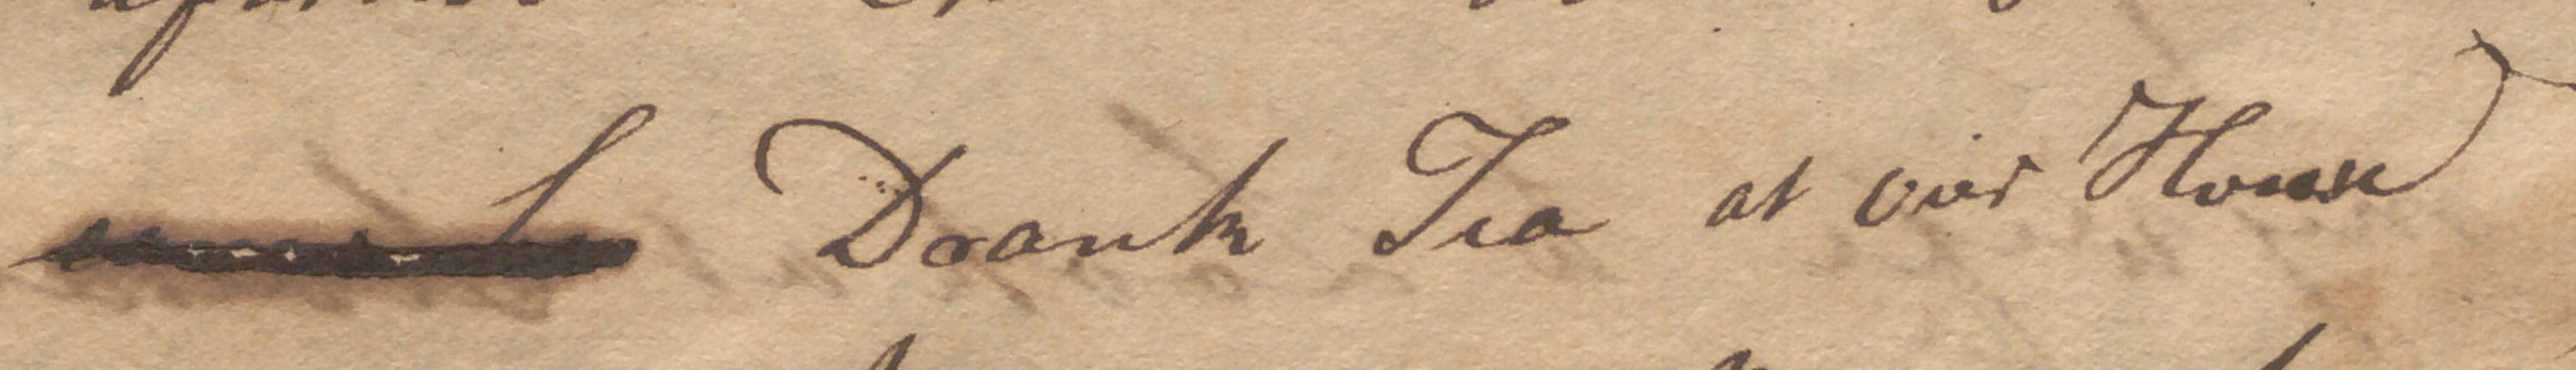[______] Drank Tea at our House
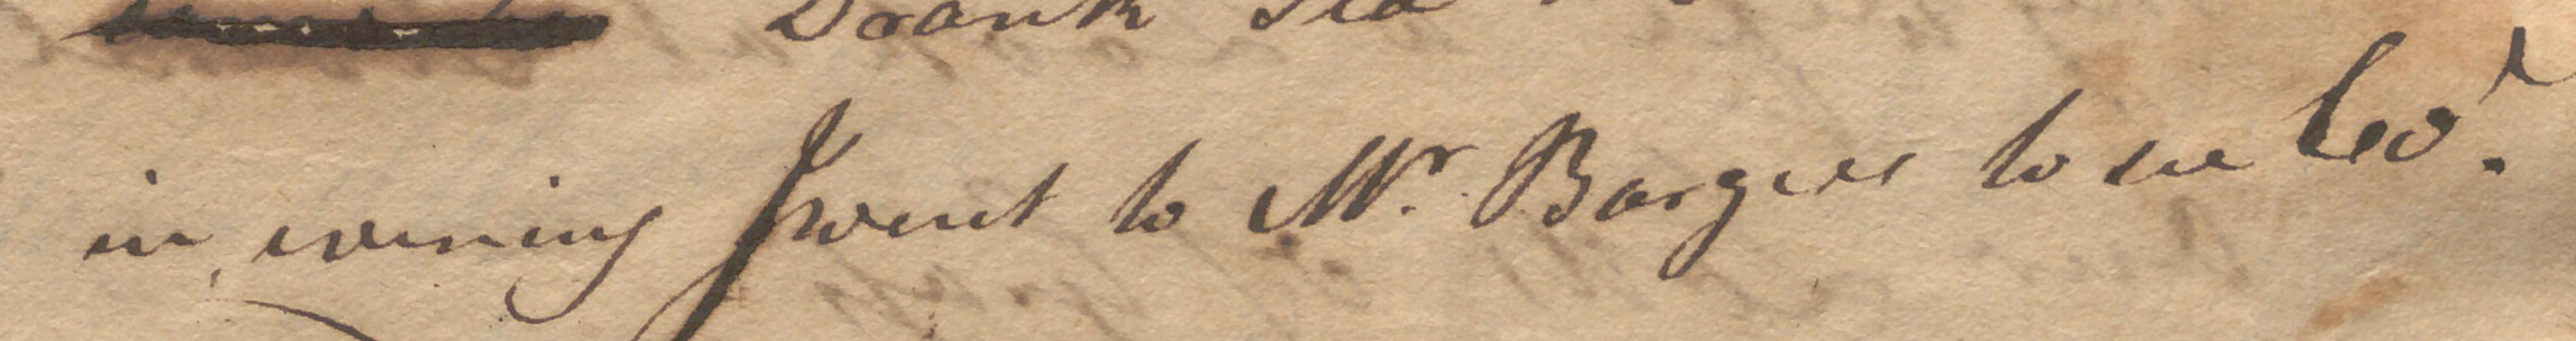in evening I went to M^r. Barges to see Co^l.
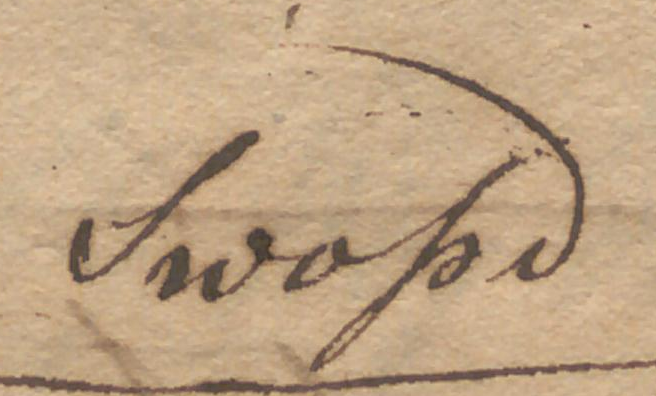Swoped
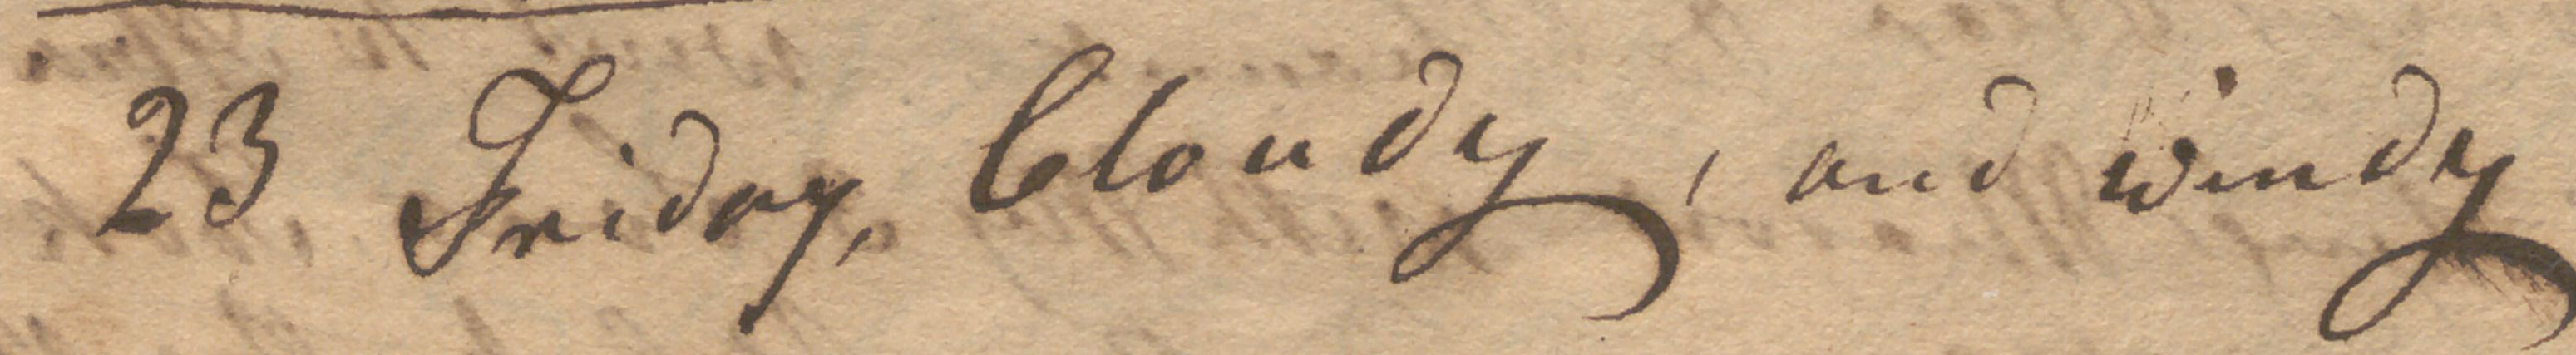23 Friday Cloudy, and windy
